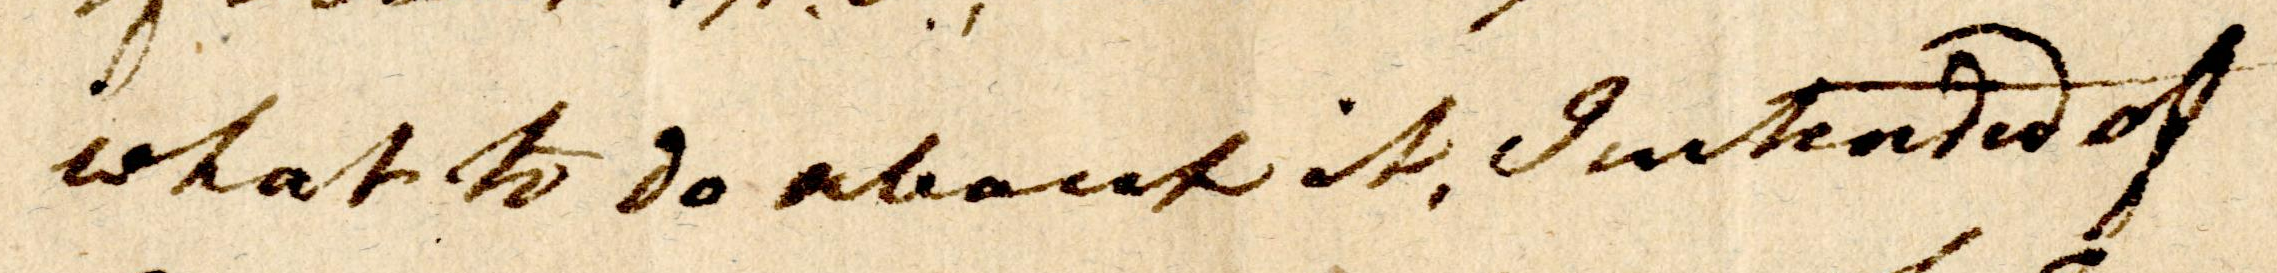what to do about it, I intended of
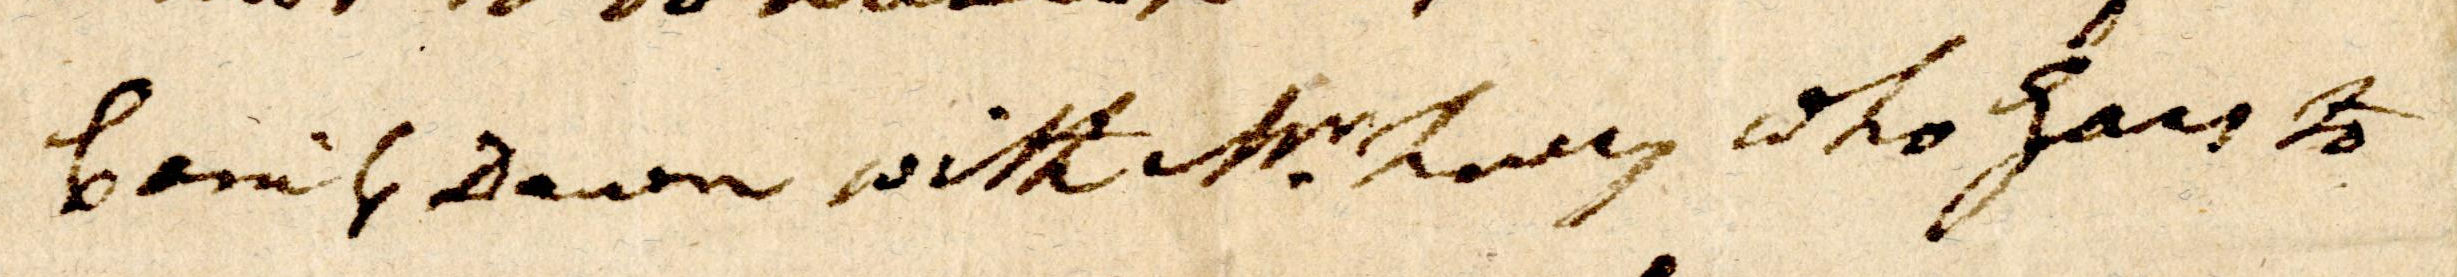Coming down with M^r. Levy who says to
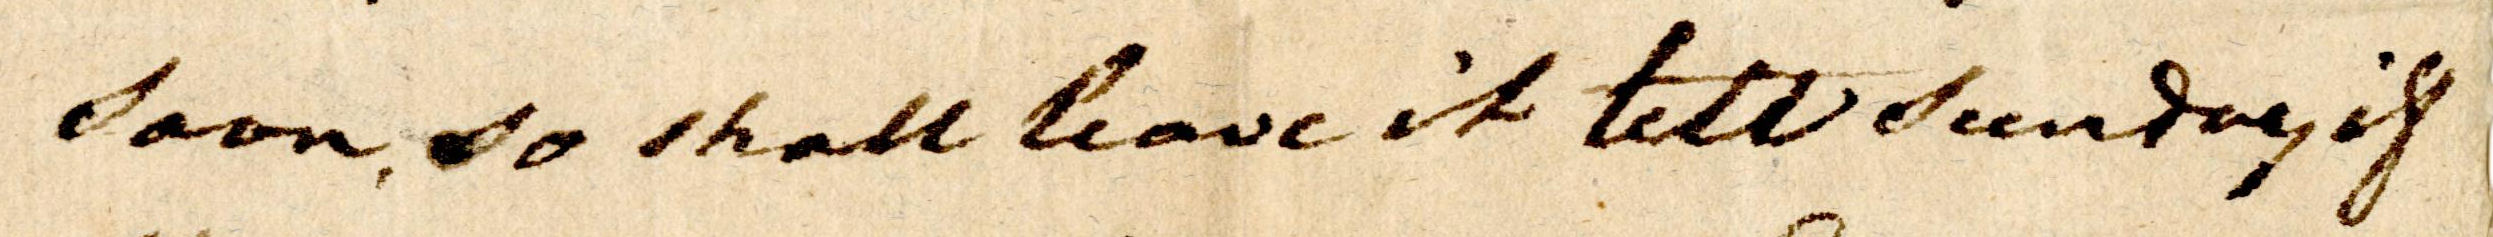soon, so shall leave it till sunday if
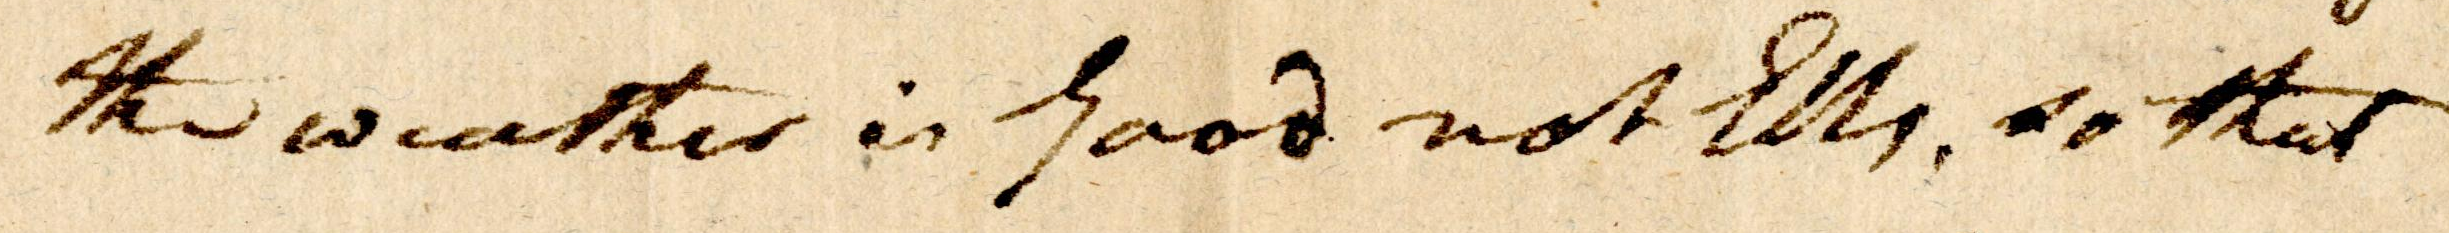the weather is good not Ells, so that
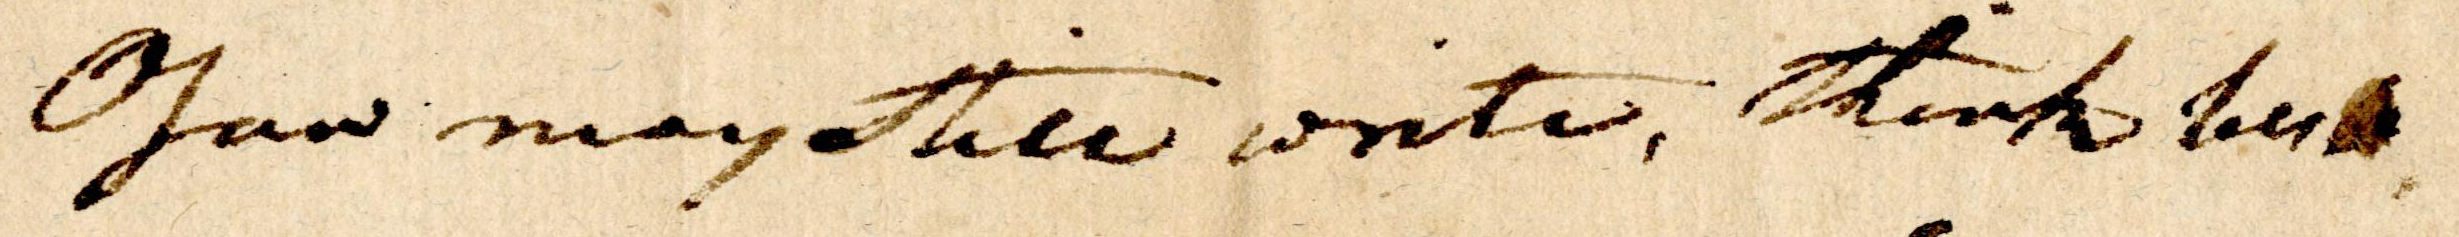you may Still write, think but
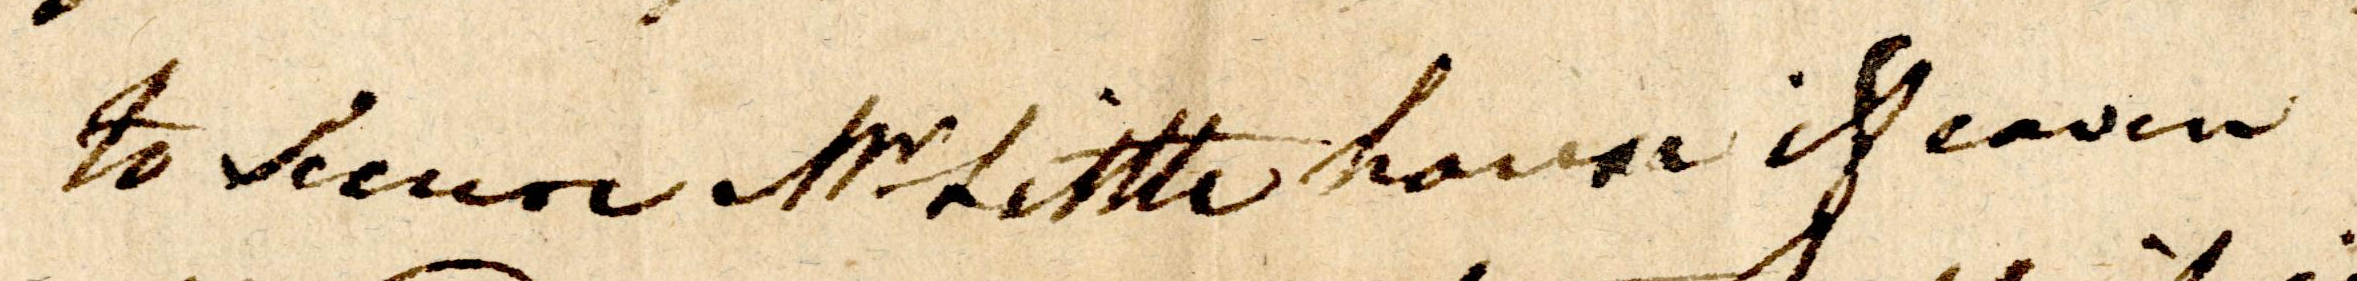to secure M^r. Little house f care
